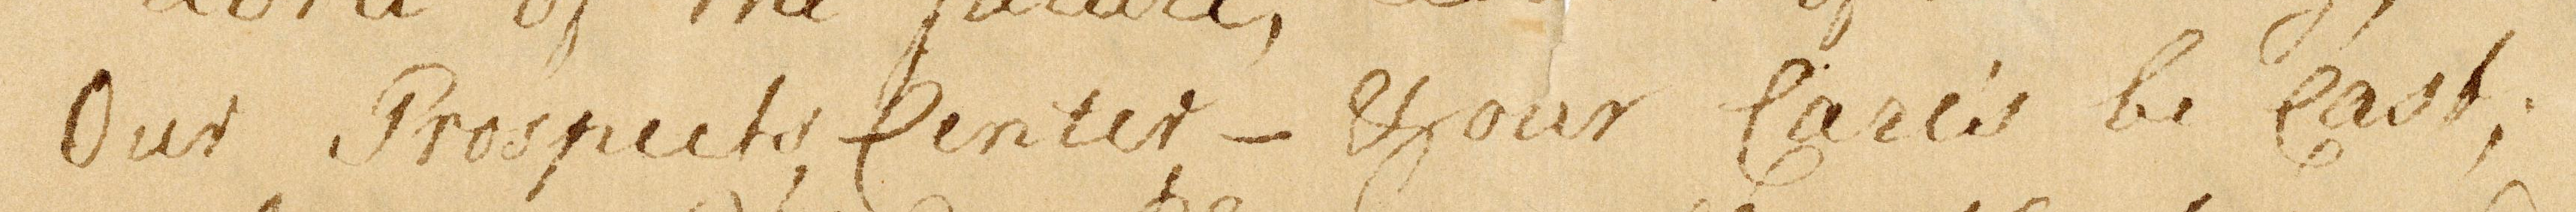Our Prospects Center- & Your Care's be cast;
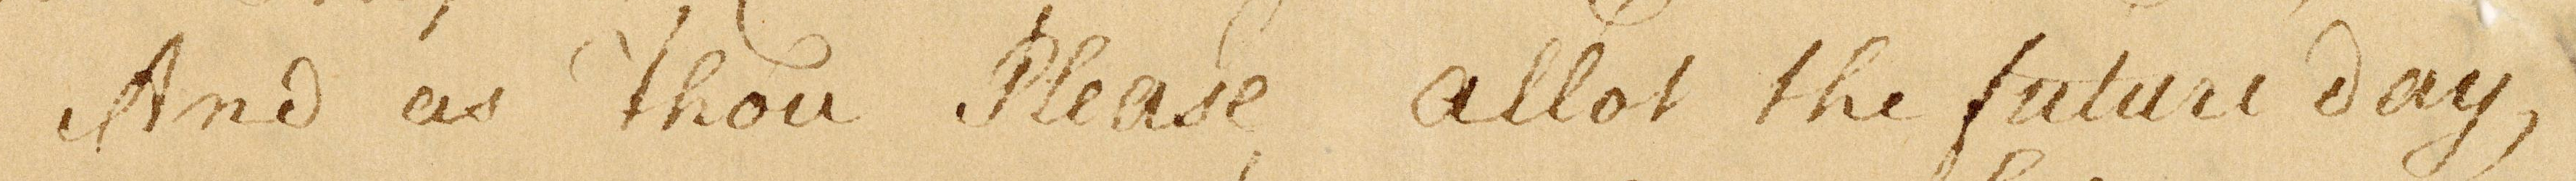And as thou Please allot the future day,
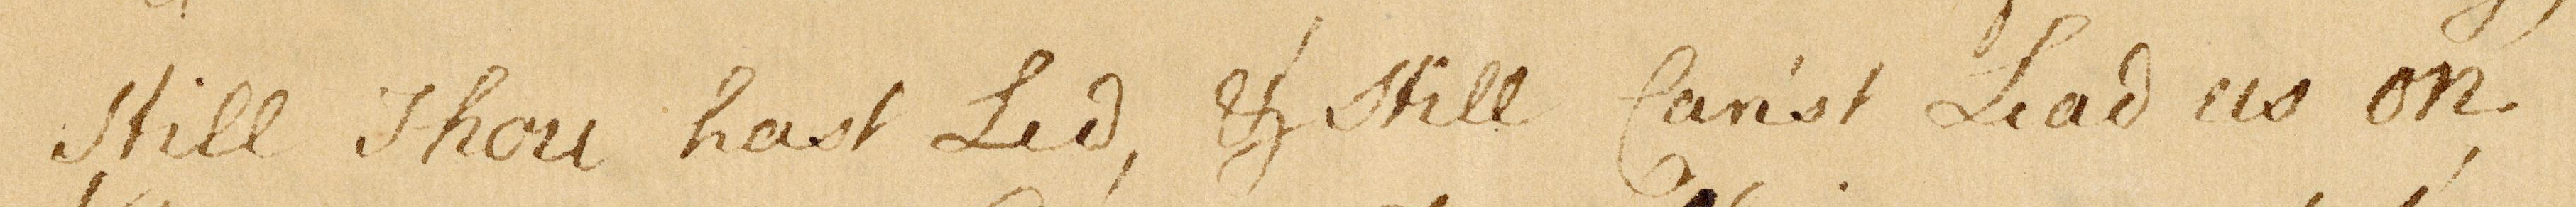still Thou hast Led, & Still Cans't Lead us on
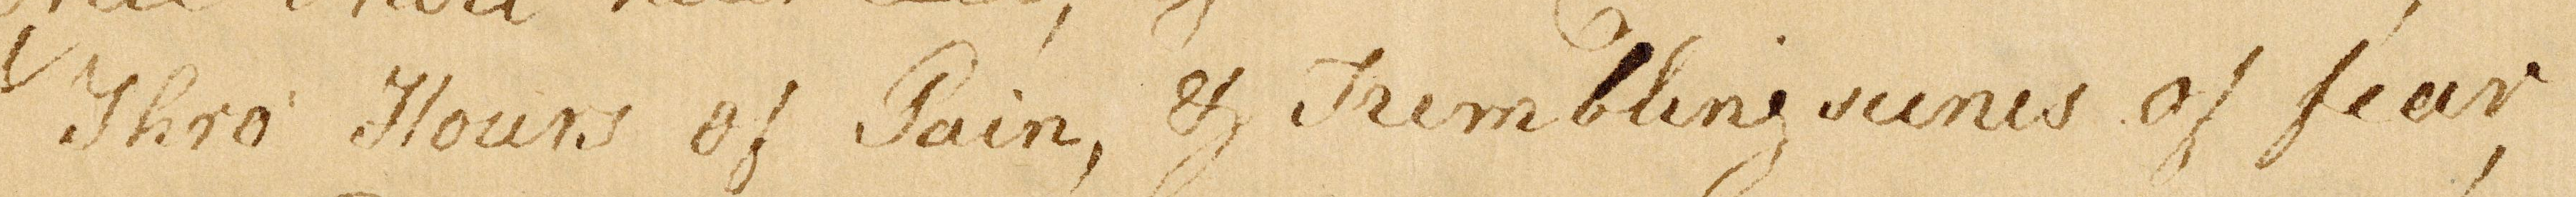Thro' Hours of Pain & Trembling scenes of fear,
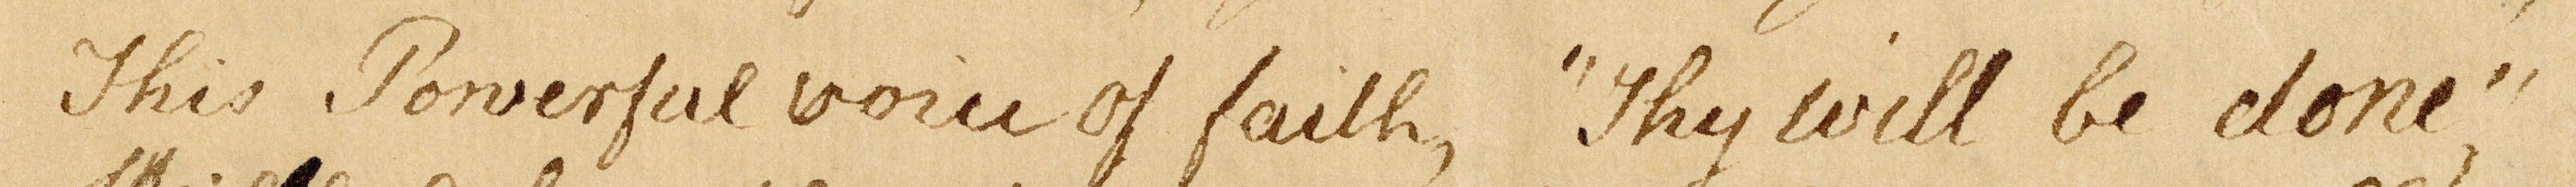This Powerful voice of faith, "Thy well be done,"
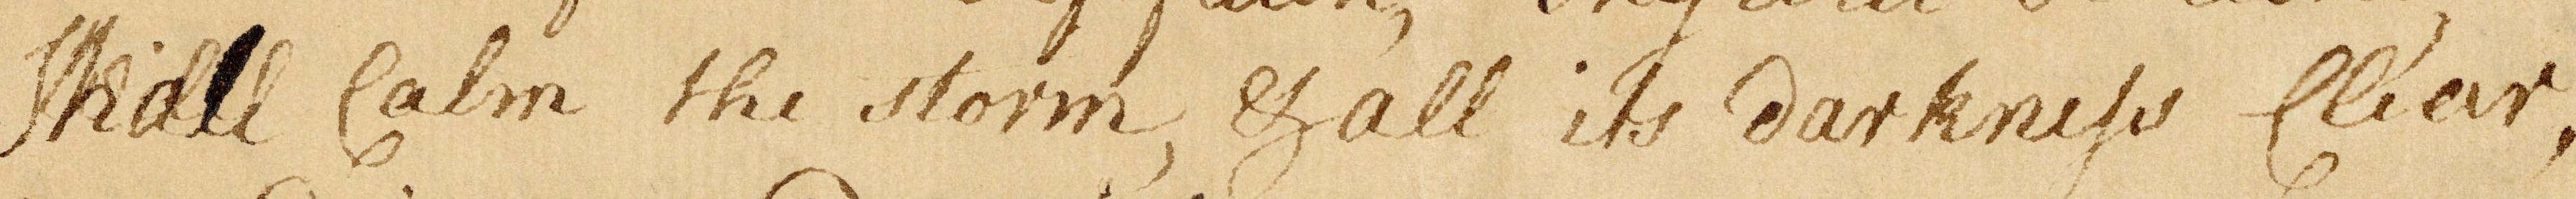Shall Calm the storm, & all its darkness Clear;
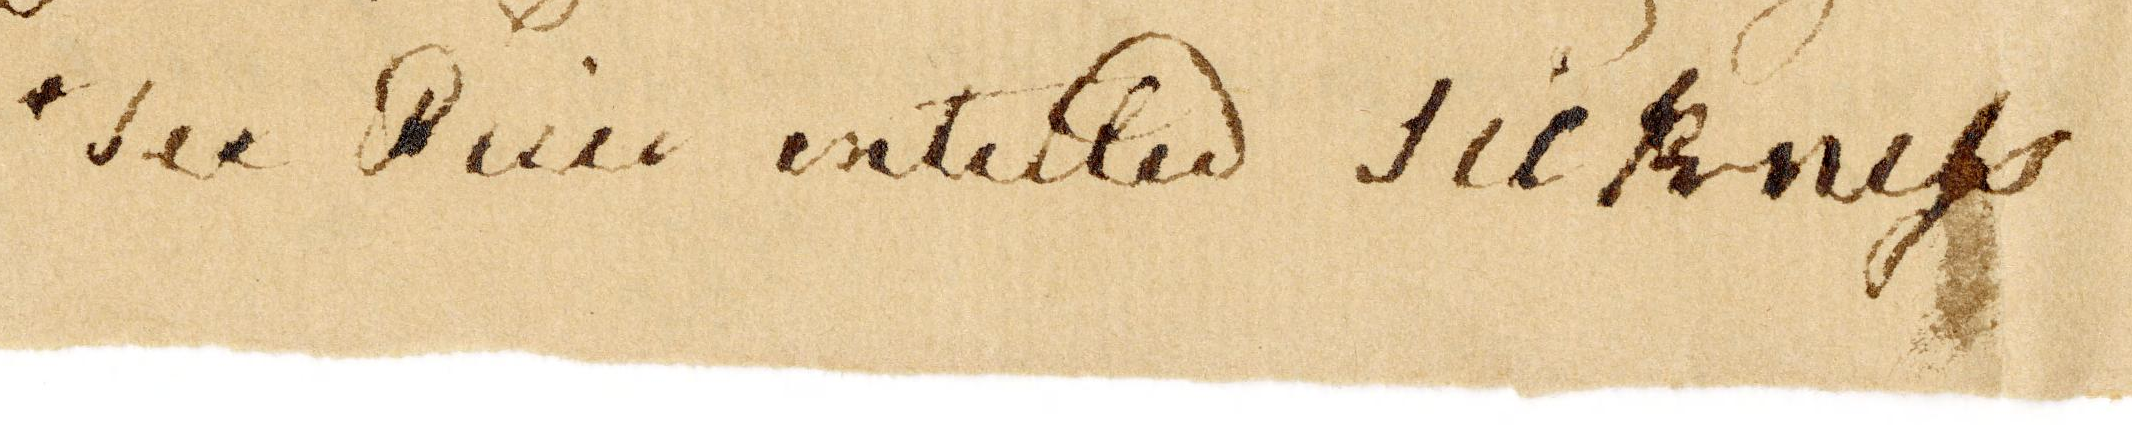[See] [Price] [entailed] sickness
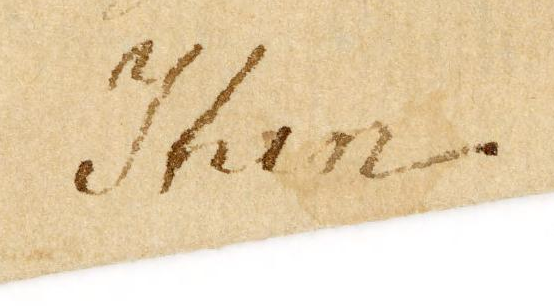Then
